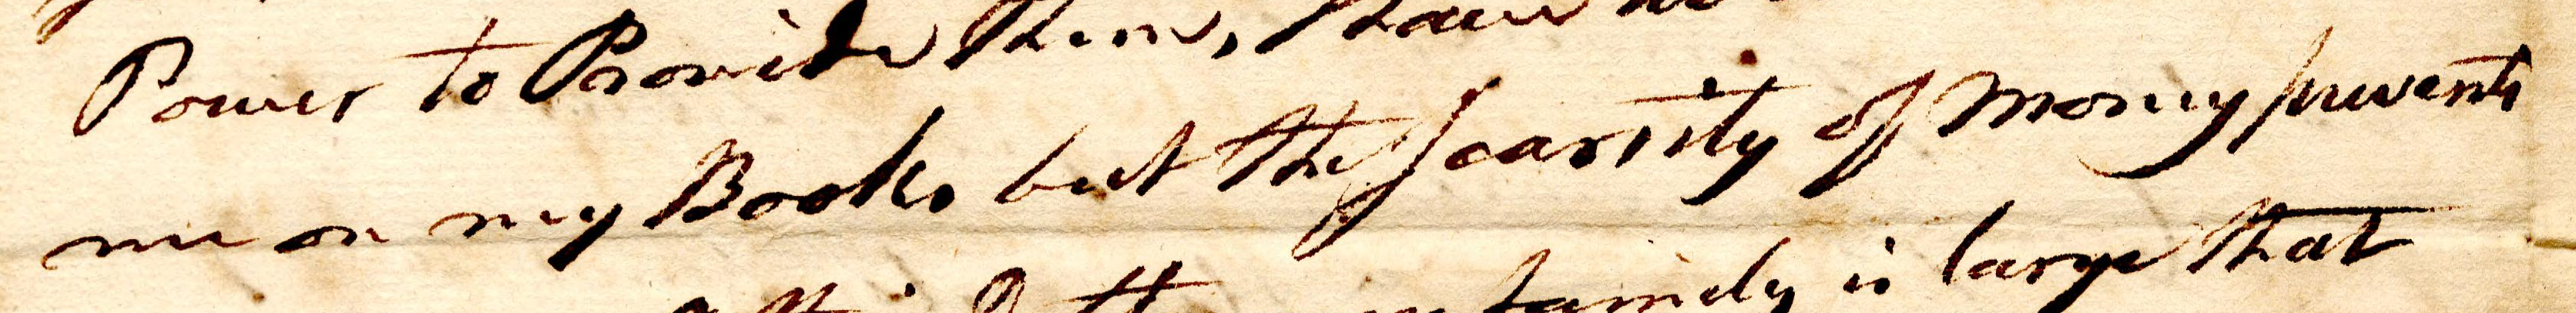me on my Books but the Scarsity of money prevents
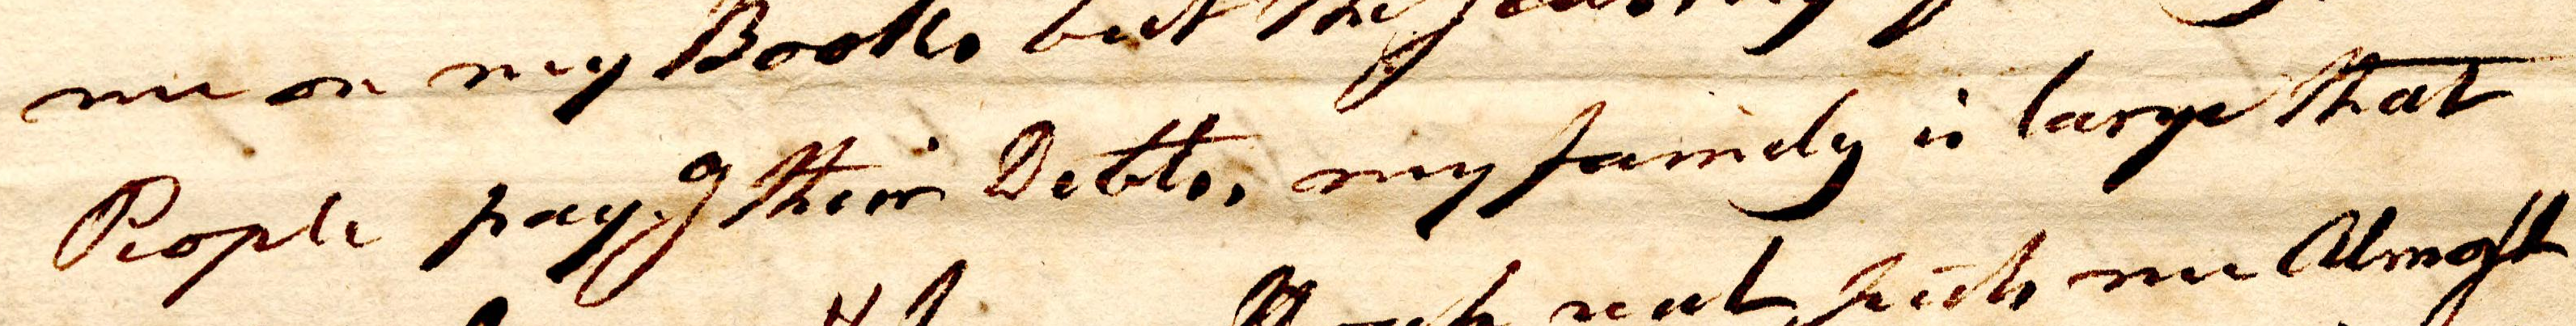People pay ^g their Debts, my family is large that
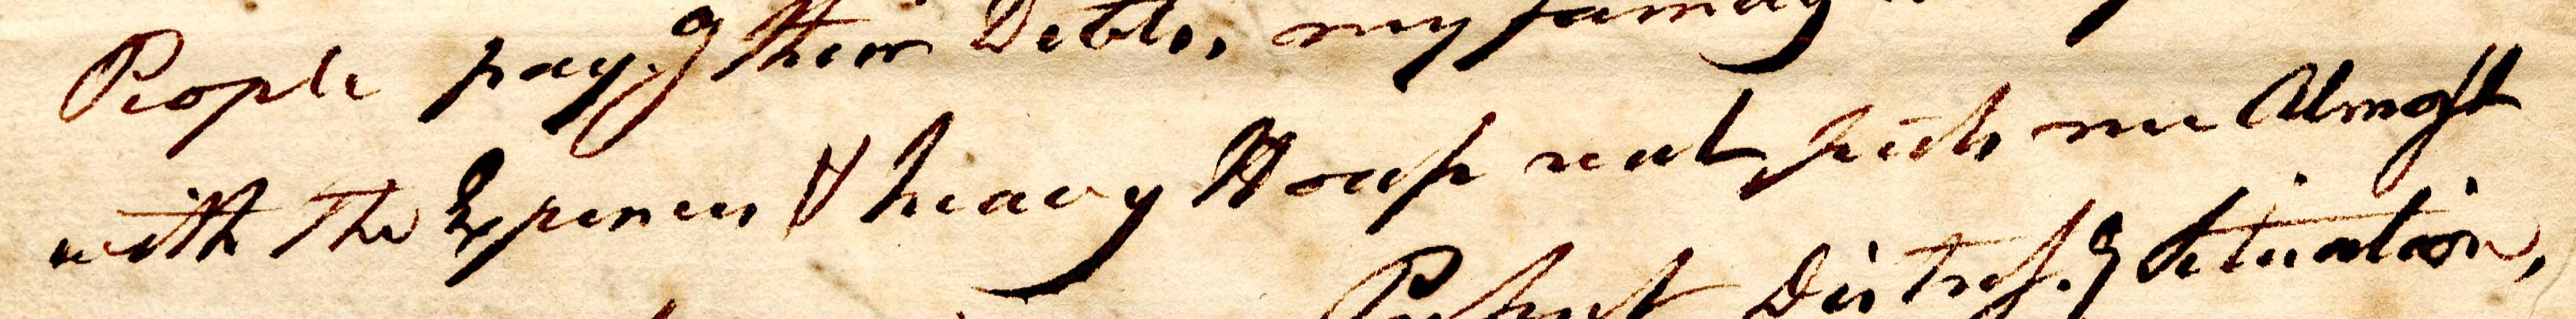with the Expenses & heavy House expects me Almost
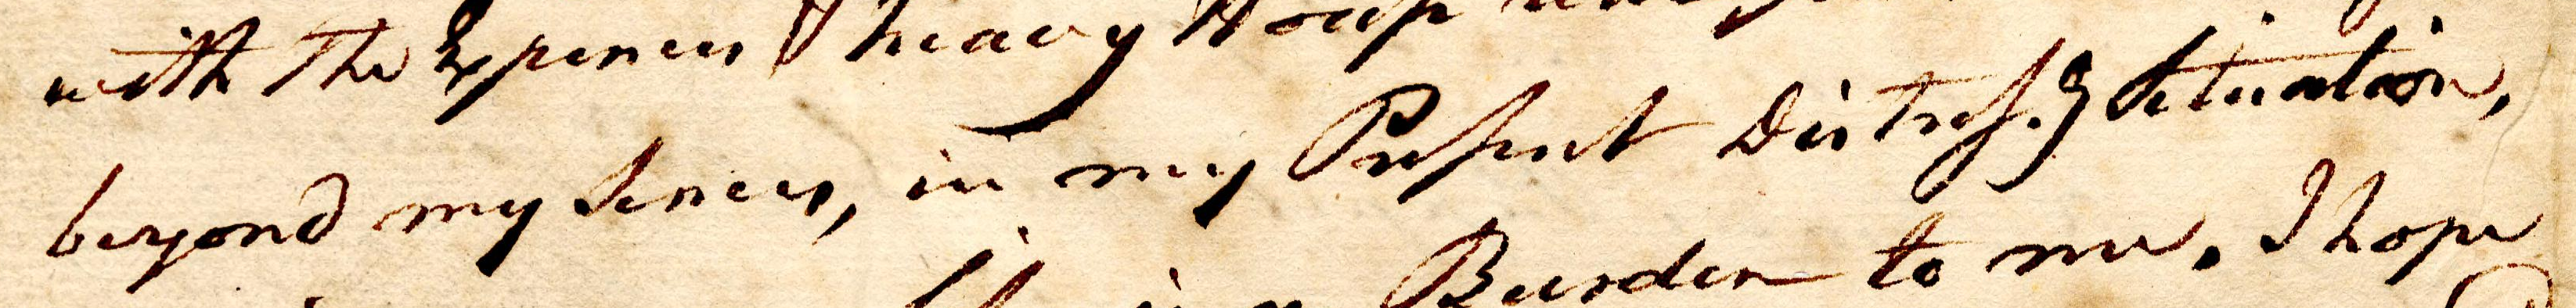beyond my Sences, in my Present distres^g. situation,
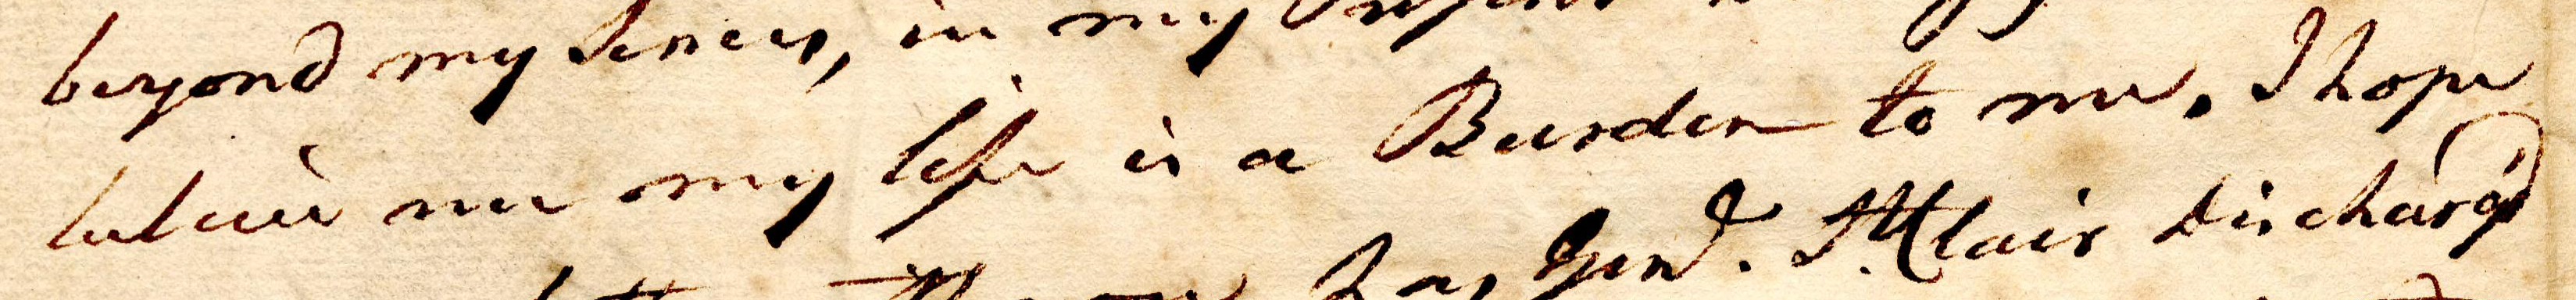believe me my life is a Burden to me, I hope
